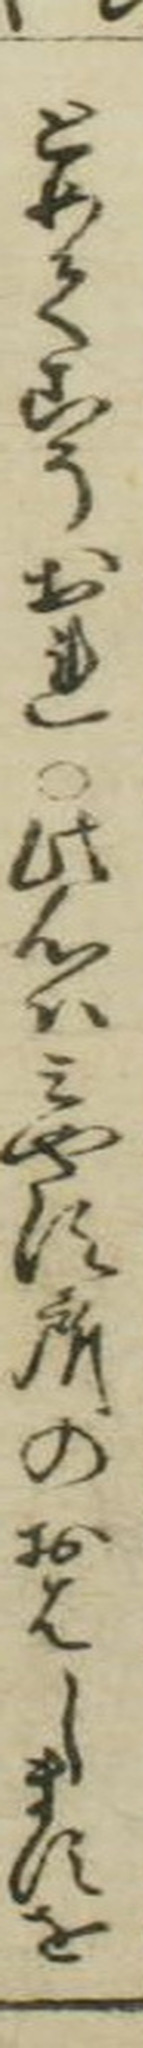とめてこそおれ○此心はみやす所のおはしますを
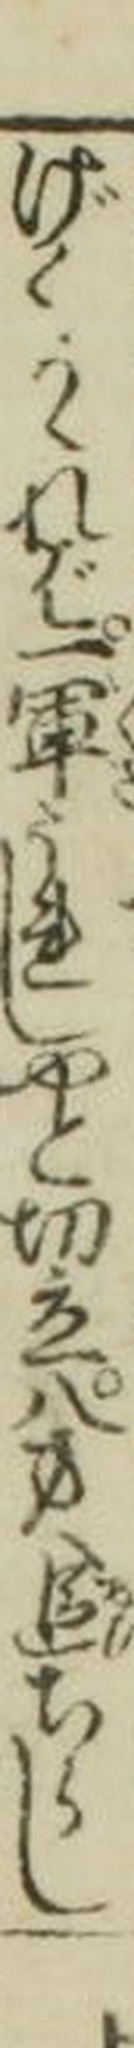げくかゝれば。一軍うれしやと切立。八方追ちらし
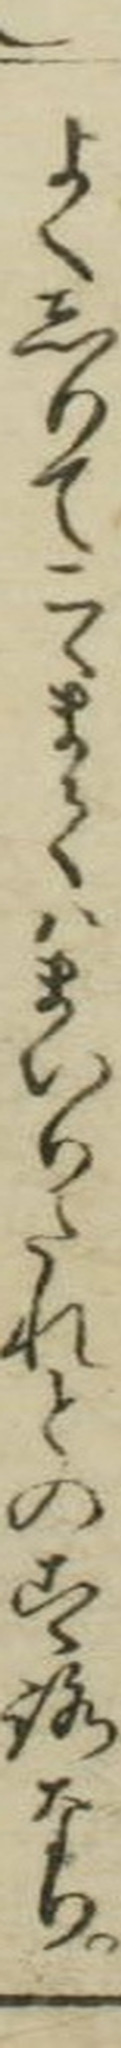よくしりてこゝまてはまいりたれとのこゝろなり。
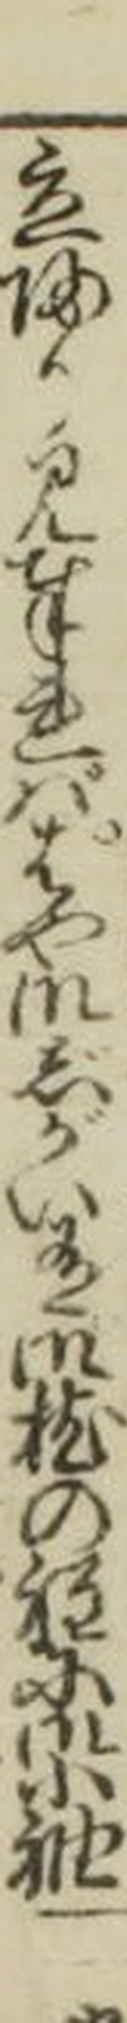立帰り見奉れば。はや御じがい有御枕の程に御小袖
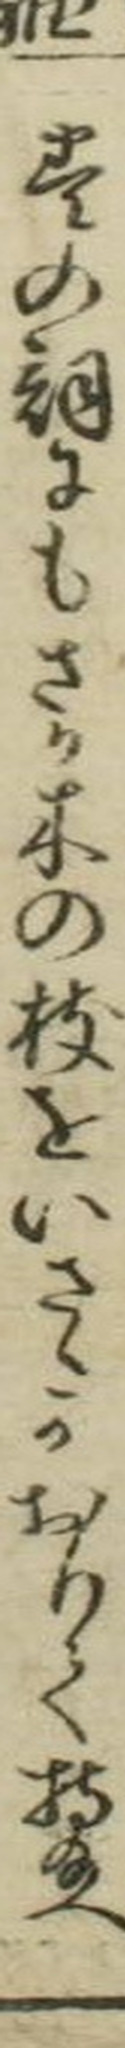巻の詞にもさか木の枝をいさゝかおりて持給へ
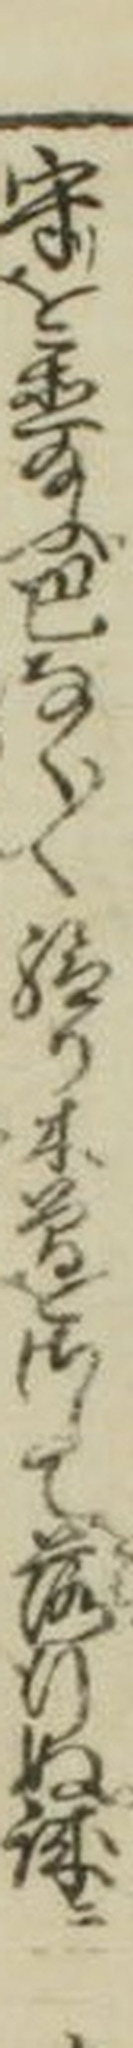守りを置給ふ。巴なく〳〵給り木曽をさして落行ぬ。誠に
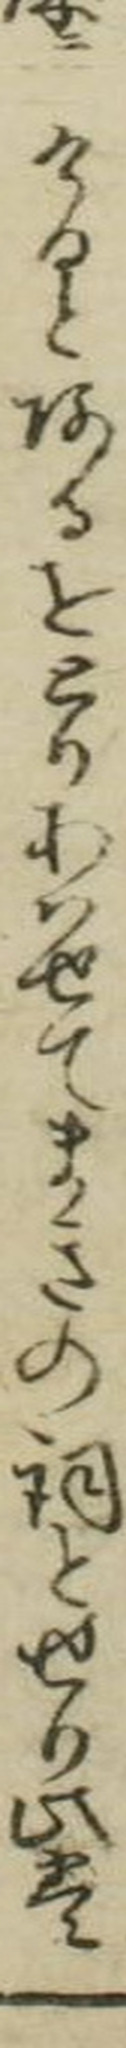けるとあるをとりあはせてまきの詞とせり此巻
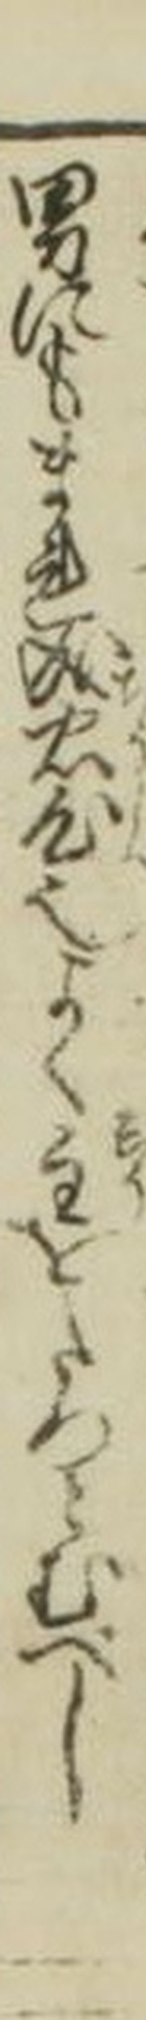男にもまれ成忠心也よく主をたつとむべし
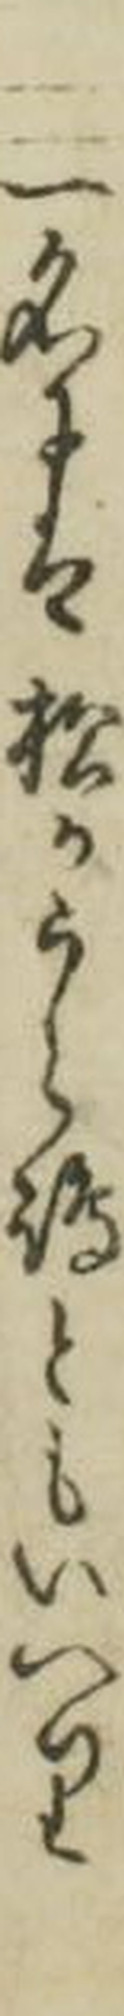一名には松からし島ともいへり
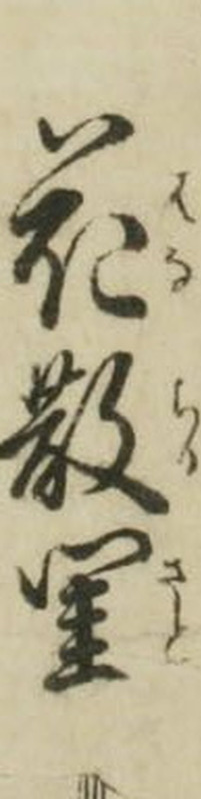花散里
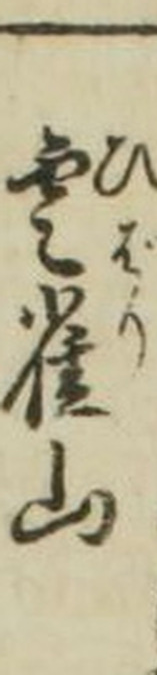雲雀山
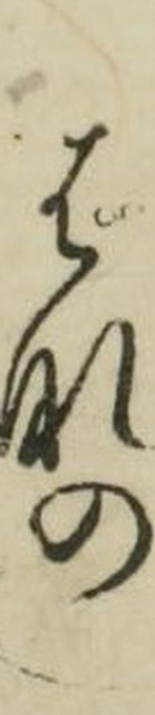ばなの
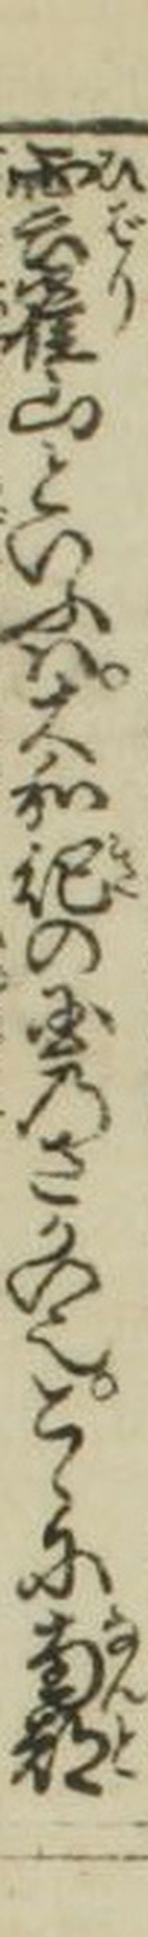雲雀山といふは。大和紀の国のさかい也。こゝに南都
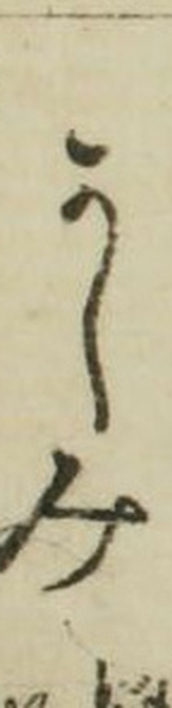かしみ
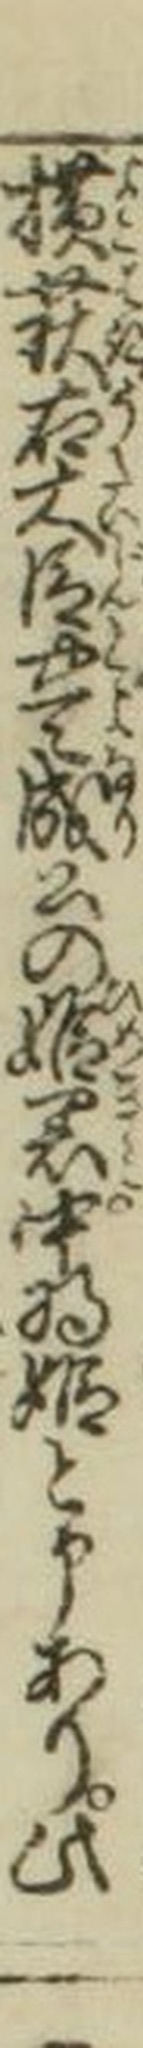横萩右大臣豊成公の姫君。中将姫と申あり。此
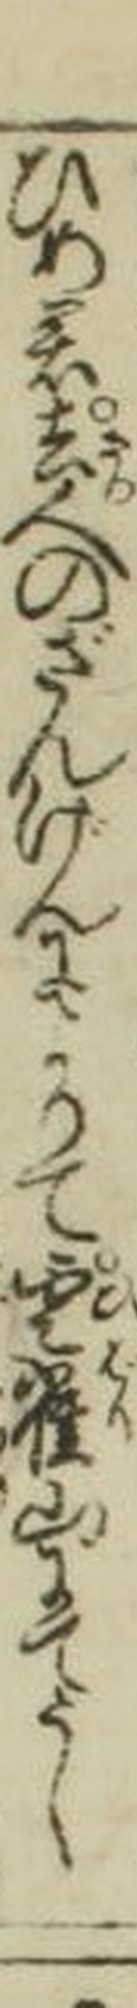ひめ君。去人のざんげんによりて。雲雀山にてうし
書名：女源氏教訓鑑
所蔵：東京学芸大学附属図書館
